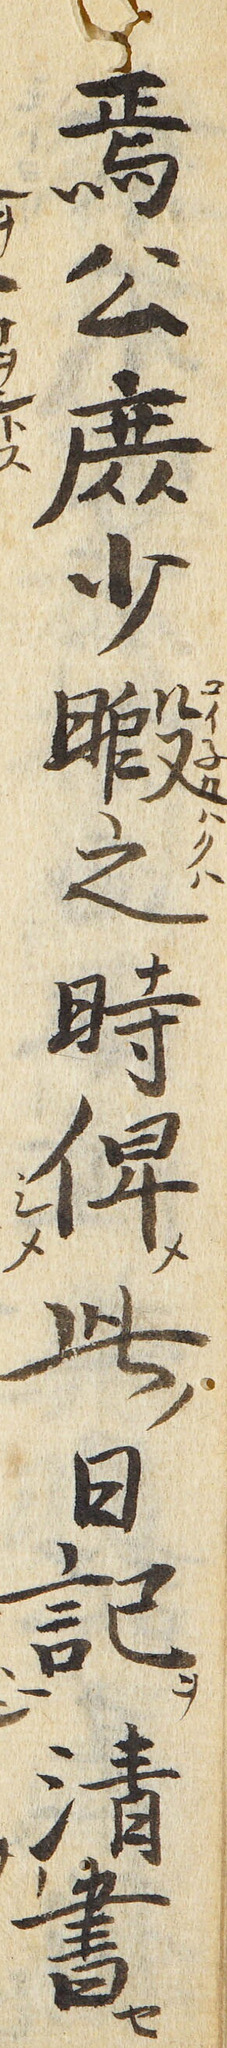焉公庶少暇之時俾メ此ノ日記ヲ清書セ
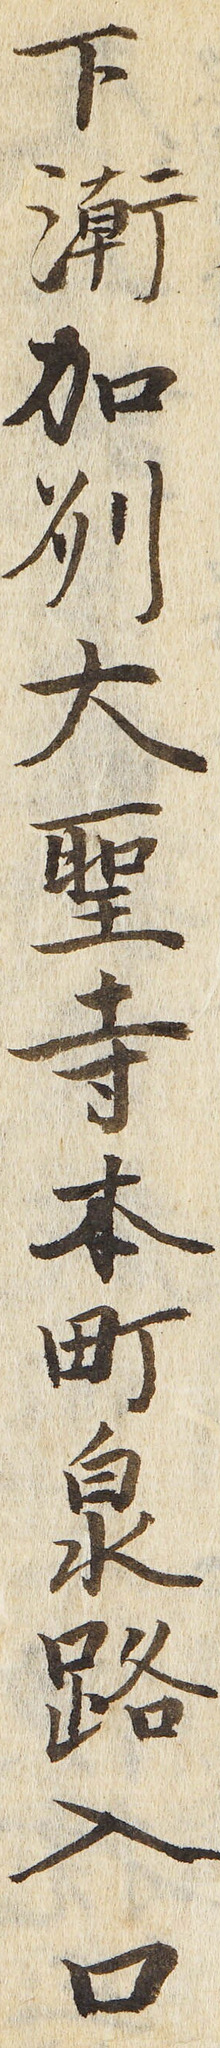下加州大聖寺本町泉路入口
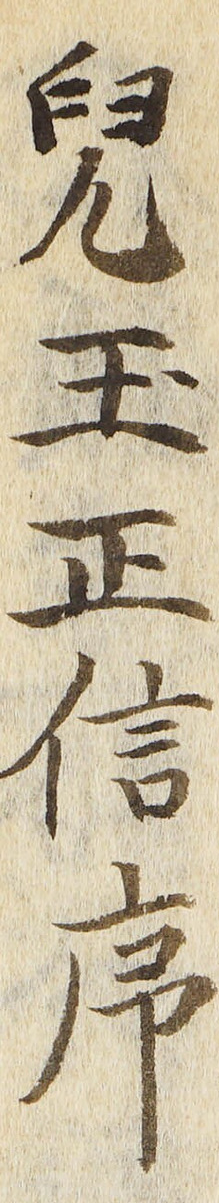児玉正信序
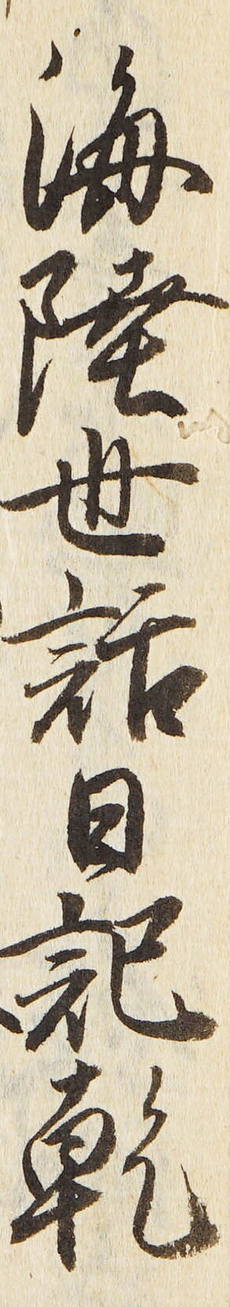海陸世話日記乾
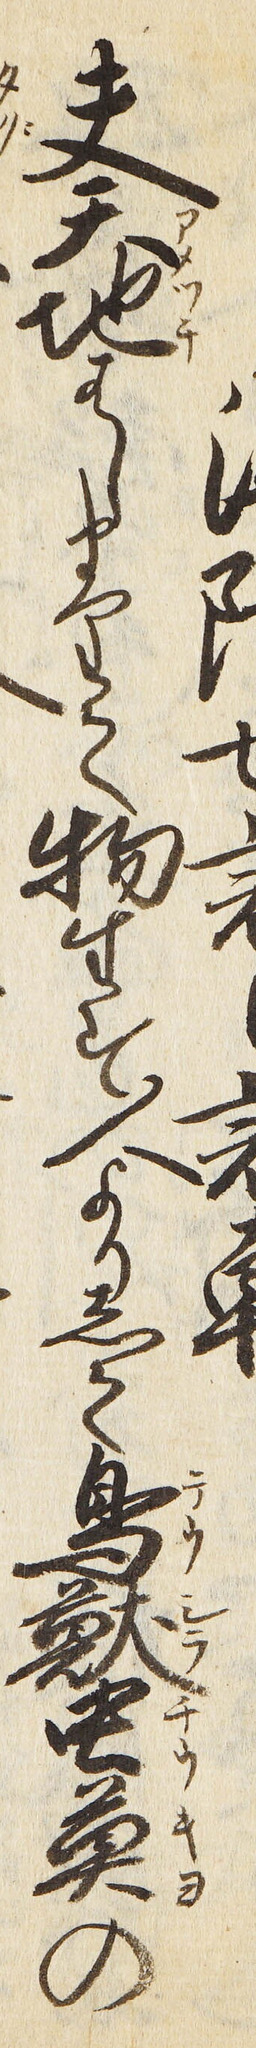夫天地はしまりて物生す人よりして鳥獣虫魚の
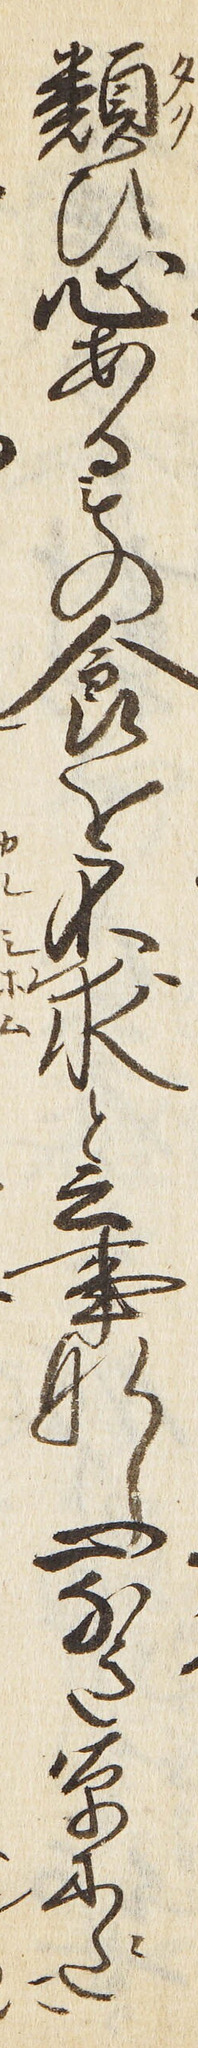類ひ心あるもの食を不求と云事なし心なき草木だに
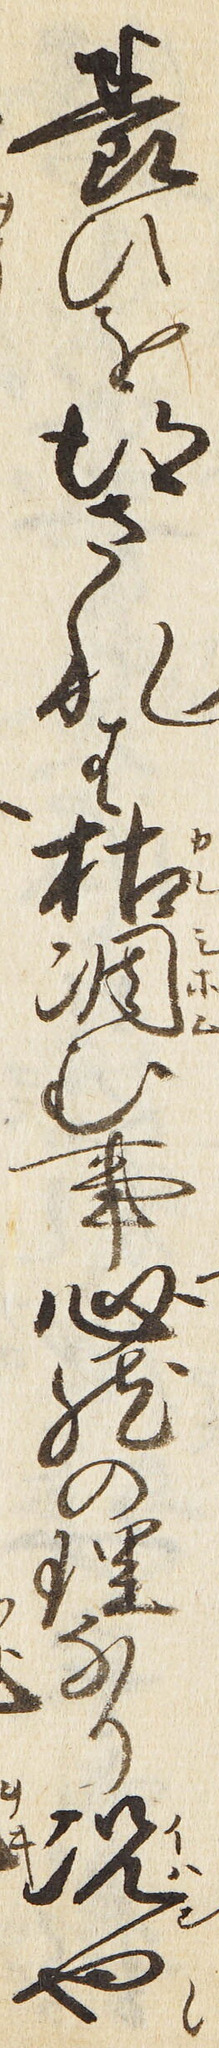養ひを得されは枯凋む事必然の理なり況や
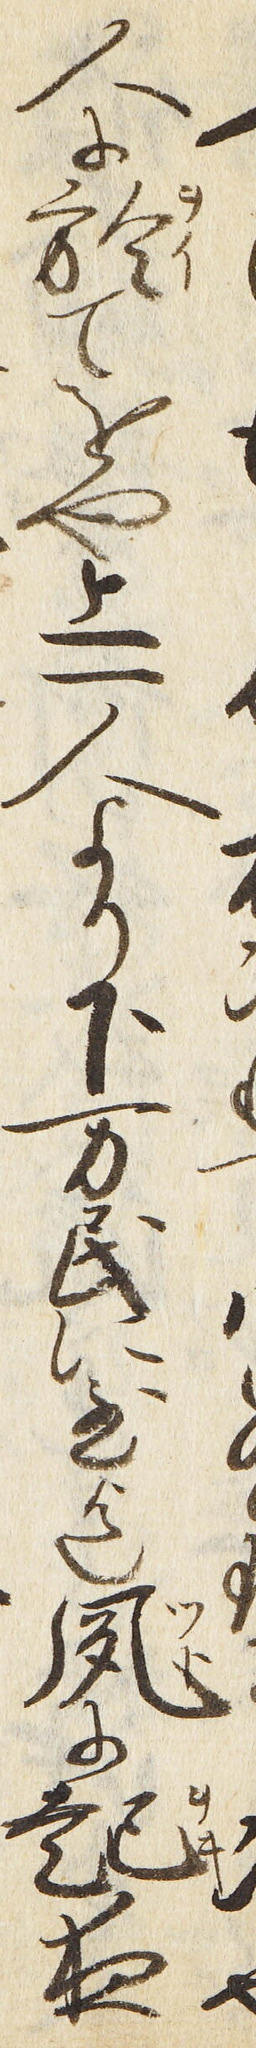人に於てをや上一人より下方民に至迄夙に起夜
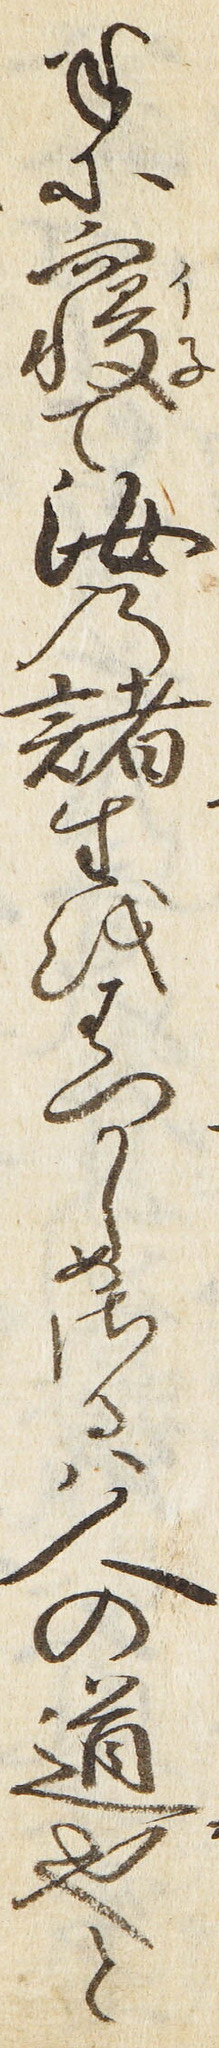半に寝て汝之諸生をはつかしめつるハ人の道也と
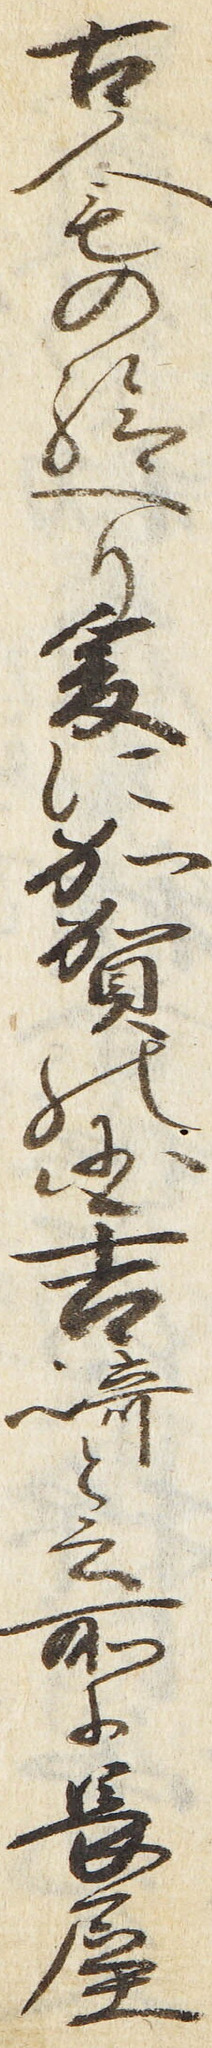古人もの給へり爰に加賀の国吉崎と云所に長屋
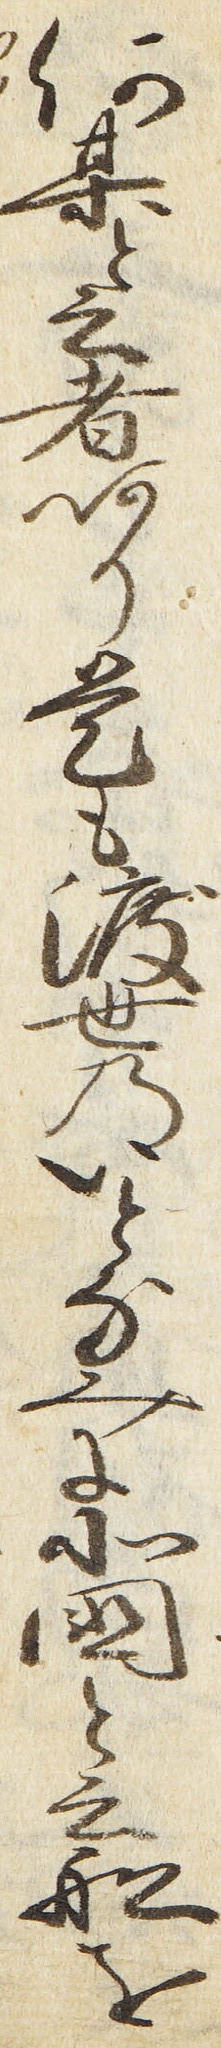何某と云者あり是も渡世のいとなみに北国と云船を
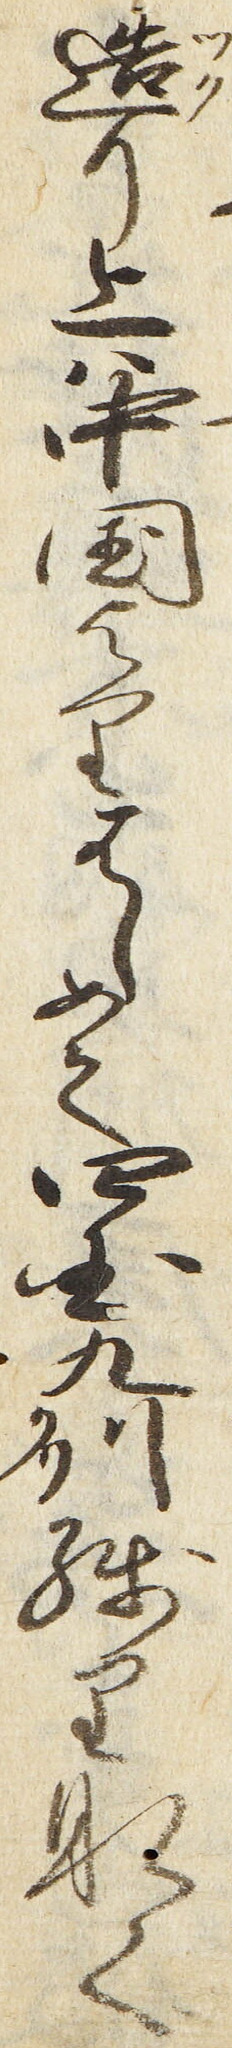造り上ハ中国よりはしめて四国九州残りなく

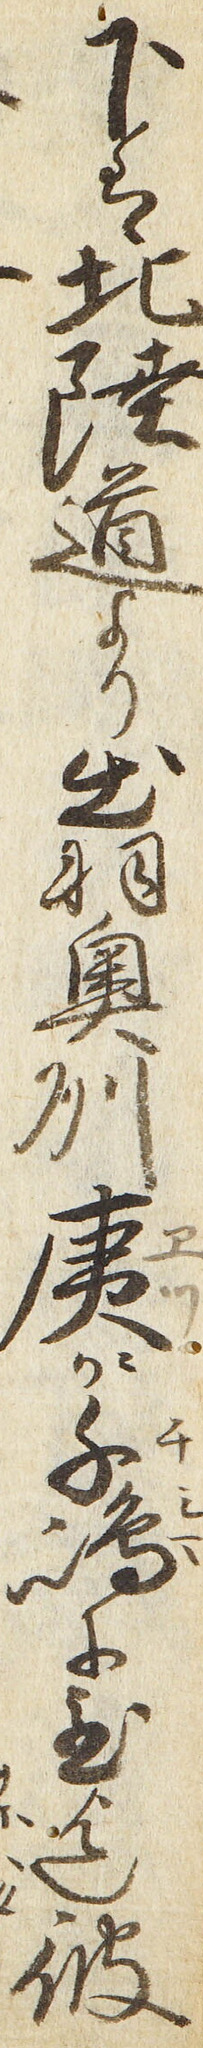下は北陸道より出羽奥州夷？が千嶋に至迄彼
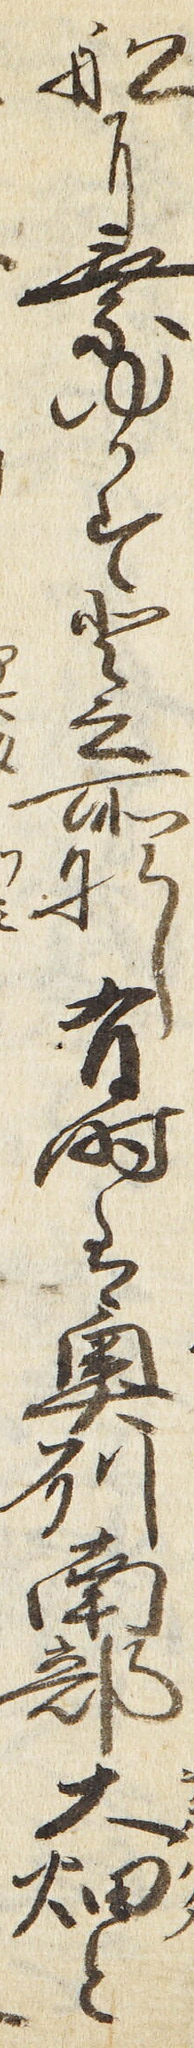船に乗ゆかすと云所なし有時は奥州南部大畑と
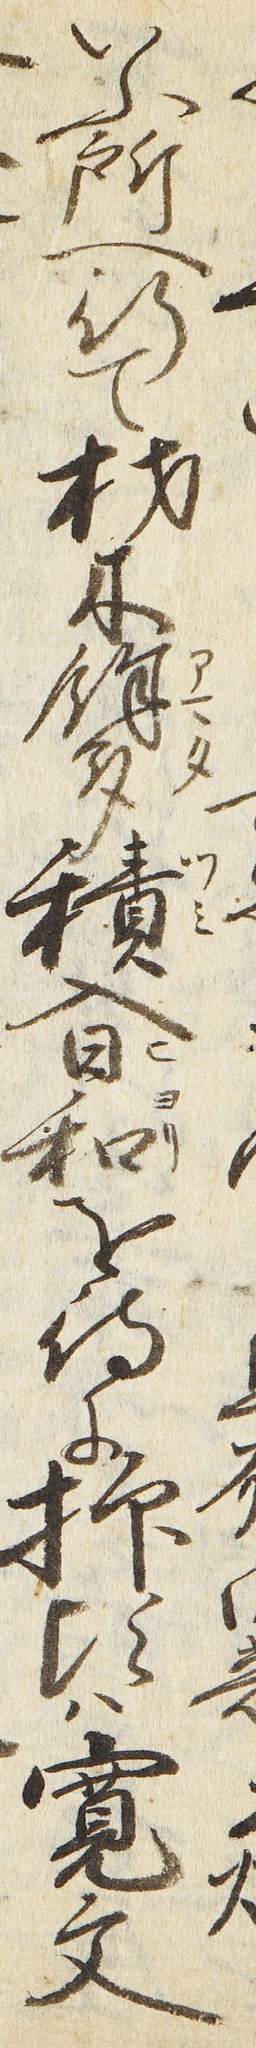いふ所へ行て材木余多積入日和を待に抑頃は寛文
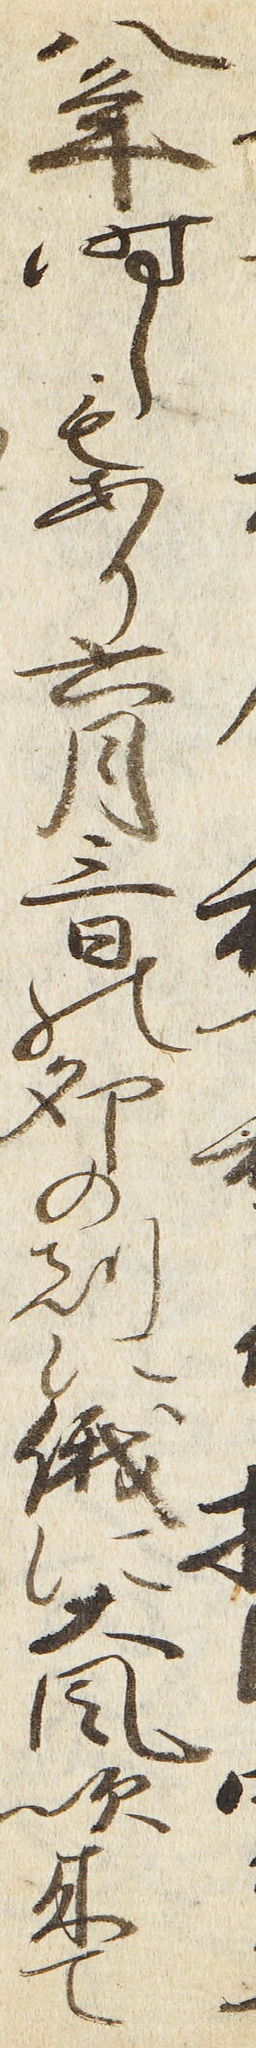八年時しもあり六月三日の卯の刻に俄に大風吹来て
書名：海陸世話日記
